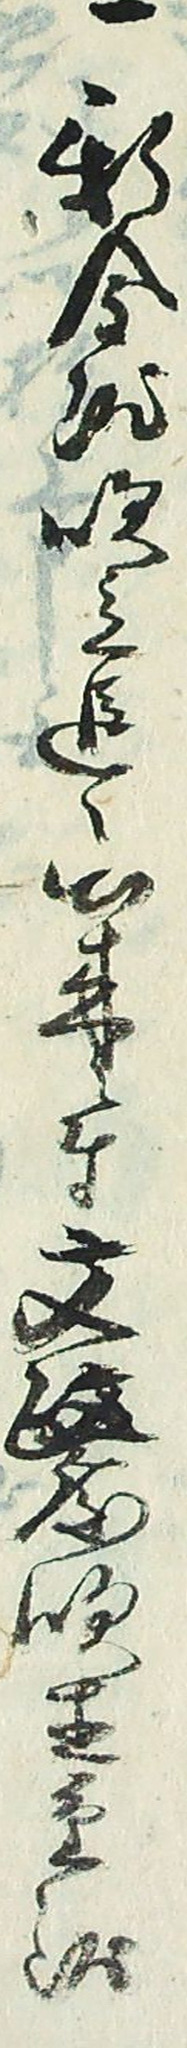一新金銀吹立追々出来に付文政度吹直金銀
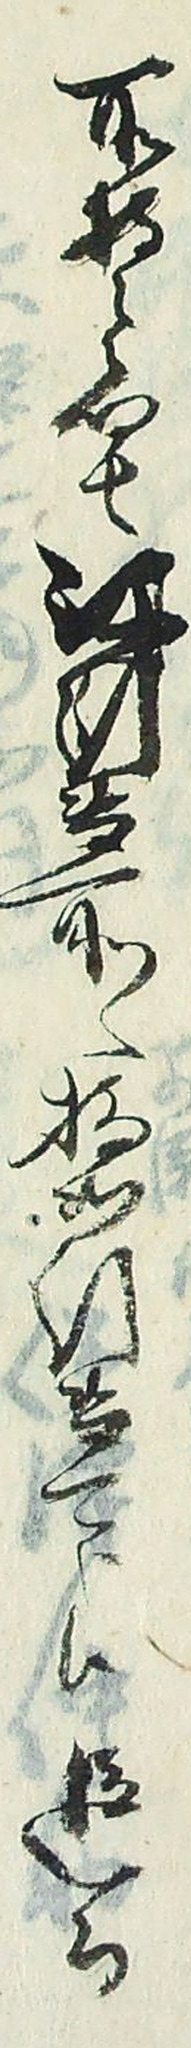所持之者は弥引替所へ指出引替可申候追而
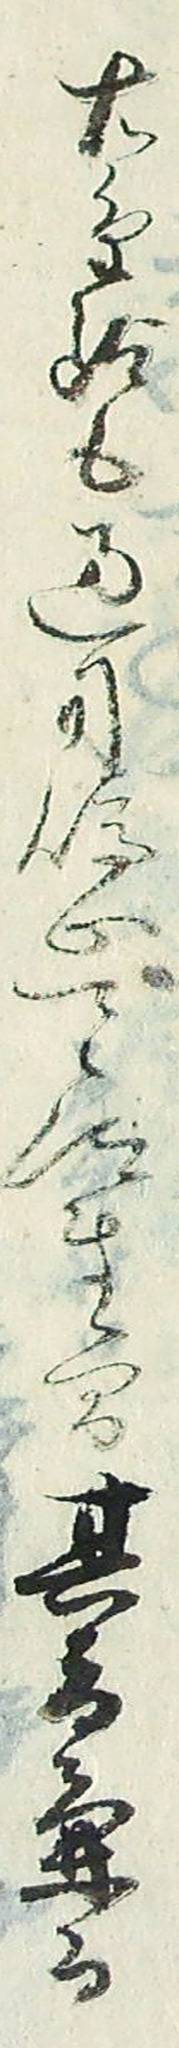右金銀も通用停止可被仰付候間其旨兼而
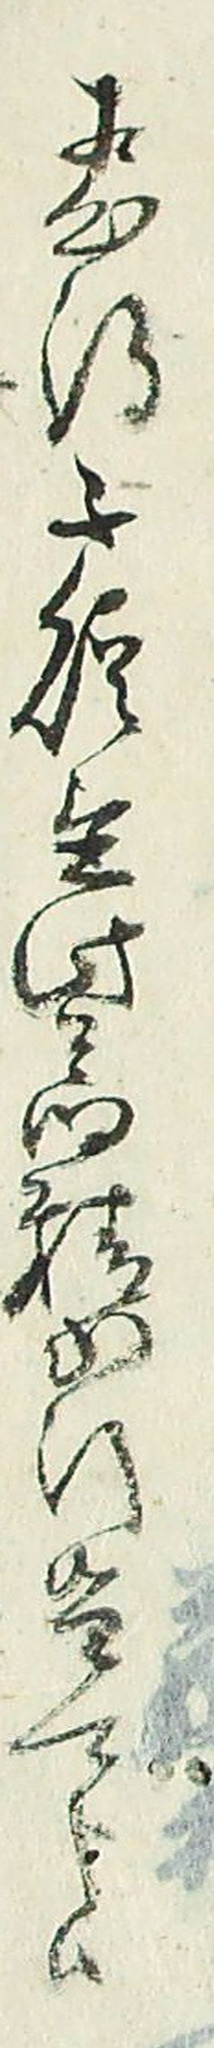相心得不貯置此節精出引替可申候

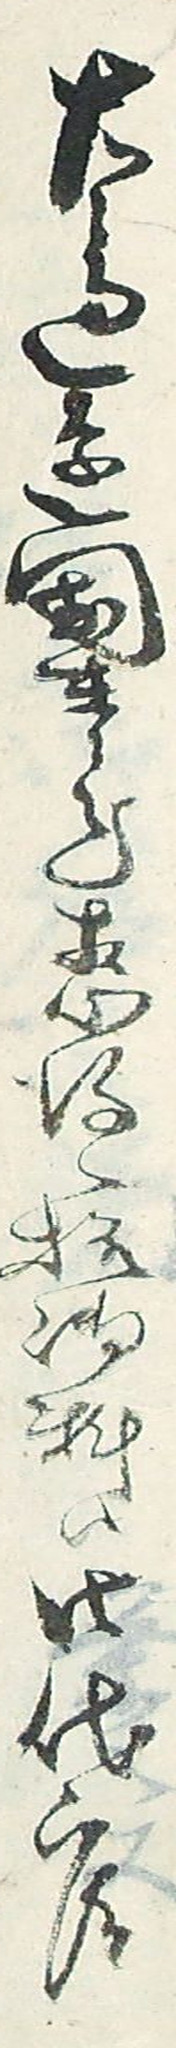右之通遠国末々迄相心得候様御料は御代官
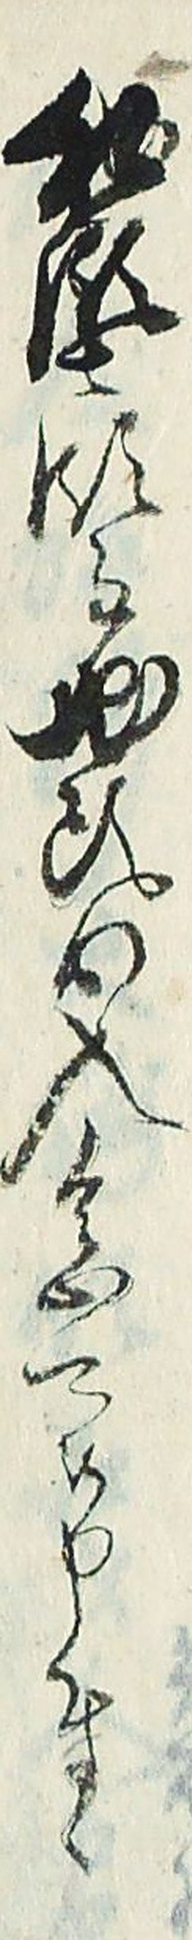私領は領主地頭ゟ入念可被申付候
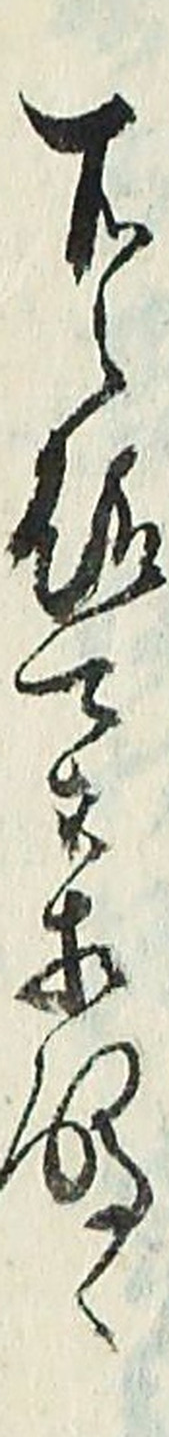右之趣可被相触候
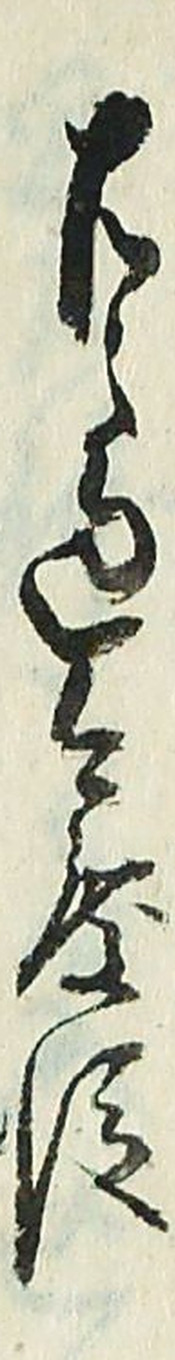右之通今度従
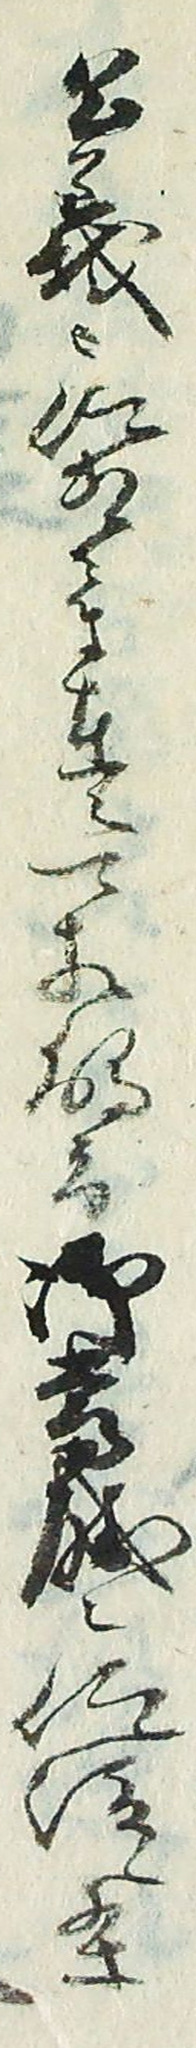公義被仰出候に付在々可相触旨御当職被仰渡候条
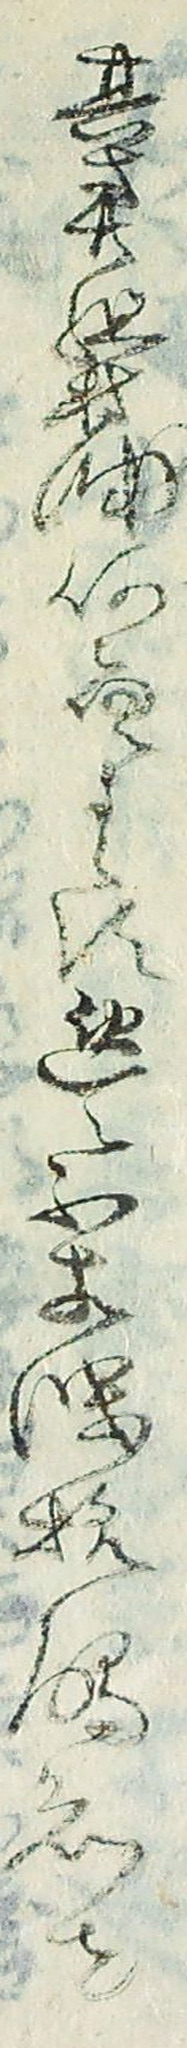其方共組村浦何者によらす逸々不相洩様触知せ
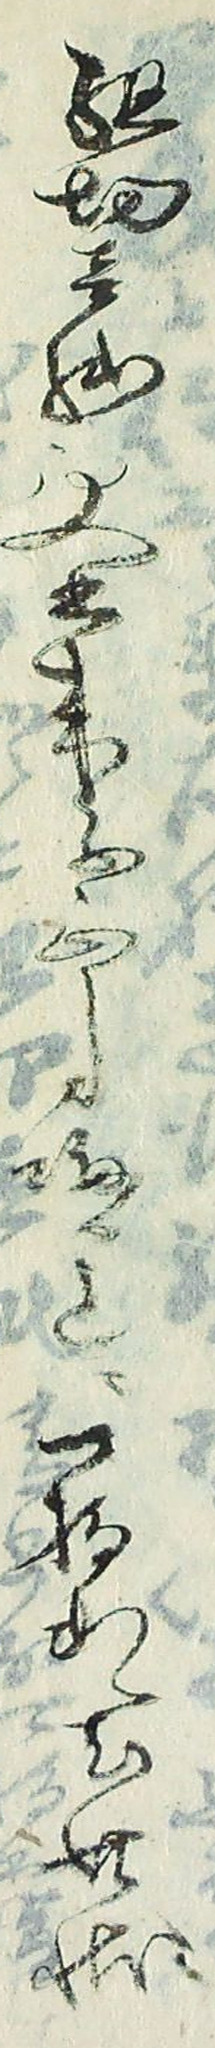組切壱紙受書来子正月晦日迄に可指出候尤此状
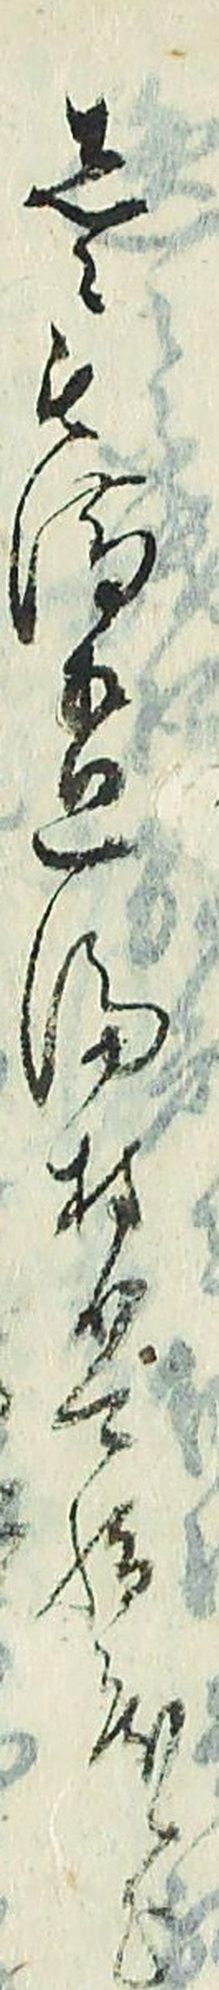先々無滞相廻済村ゟ可指戻候以上
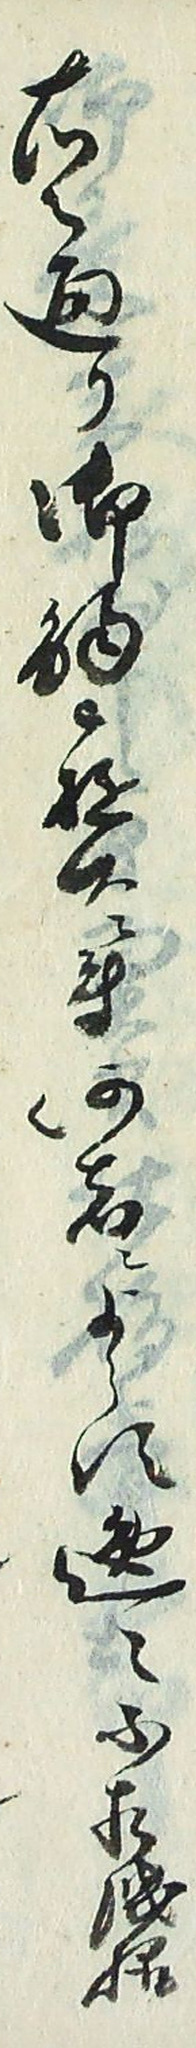右之通り御触被遊候に付何者によらす逸々不相洩様
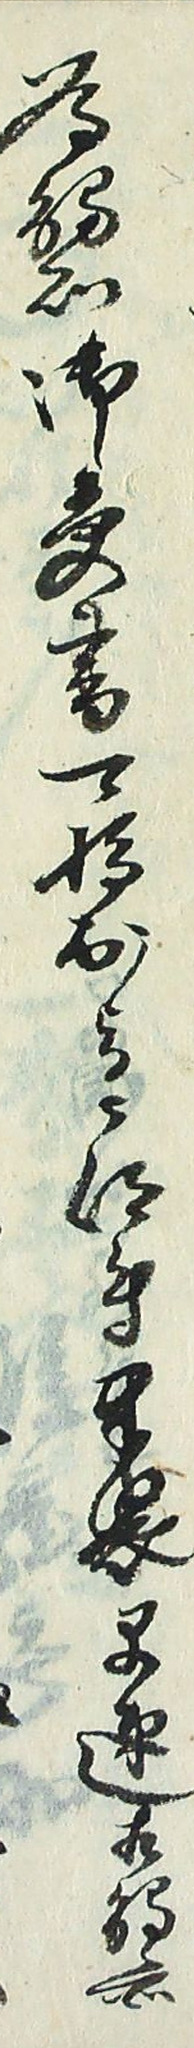為触知御受書可指出旨被仰付奉畏早速相触候所
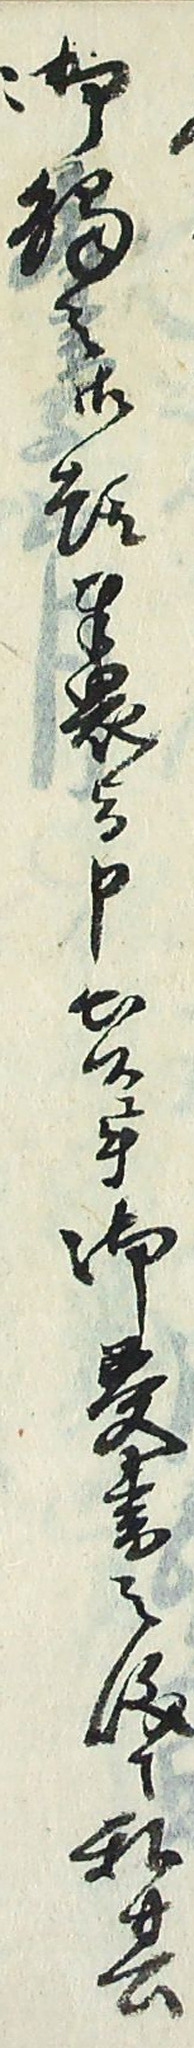御触之御趣奉畏旨申出候に付御受書之儀は私共
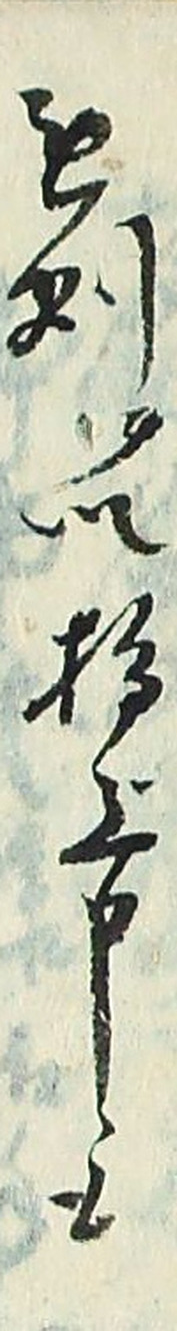連判を以指上申候以上
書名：諸御用御□受書控
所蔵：鳴門教育大学 Naruto University of Education
